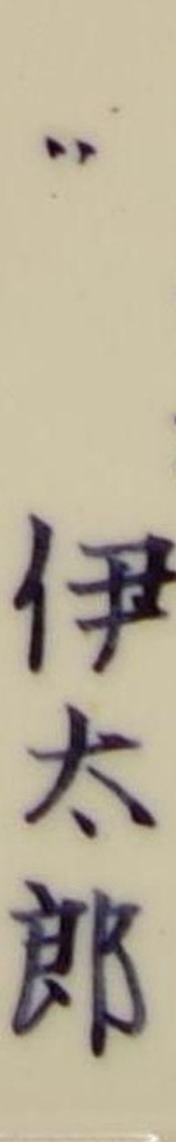伊太郎
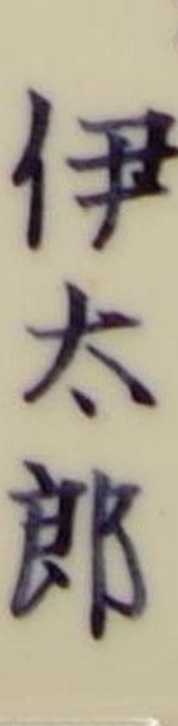伊太郎
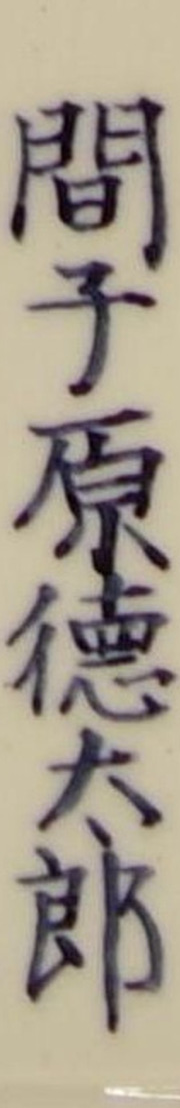間子原徳太郎
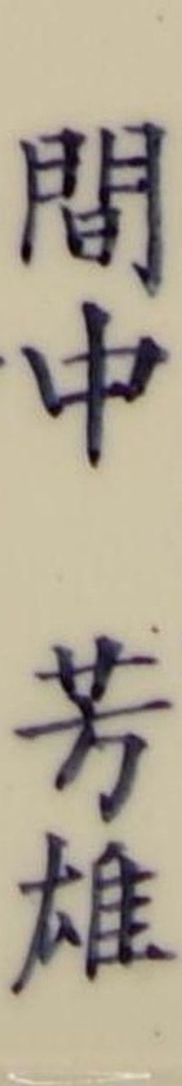間中芳雄
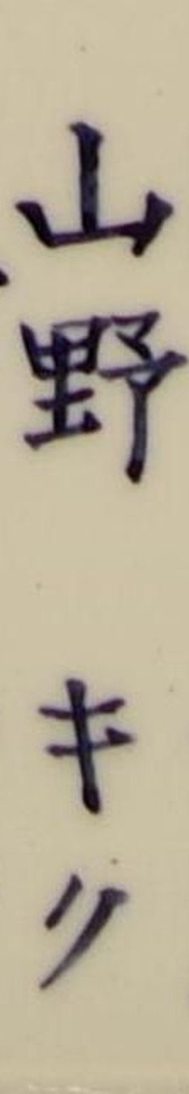山野キク
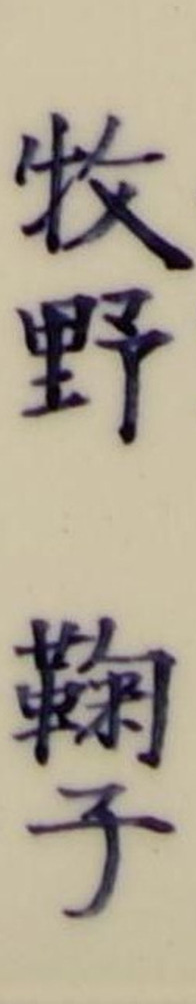牧野鞠子
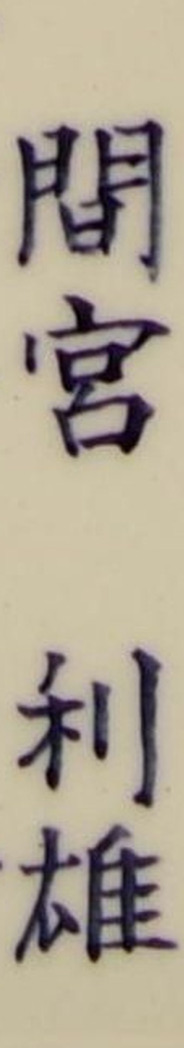間宮利雄
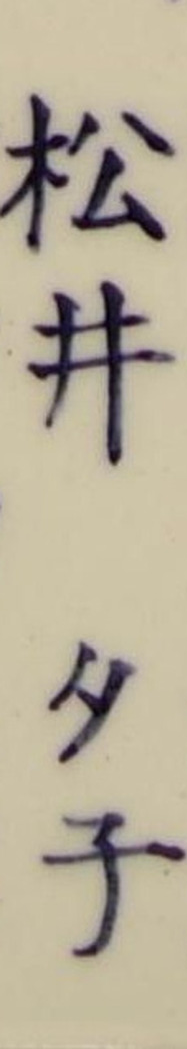松井夕子
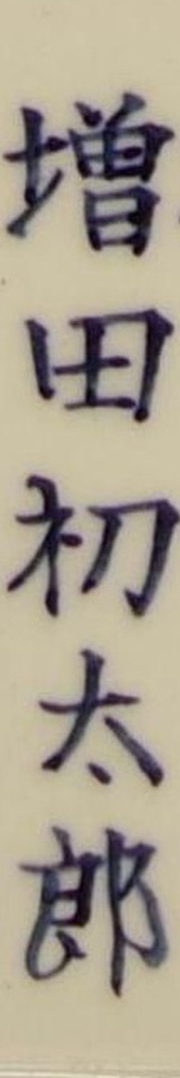増田初太郎
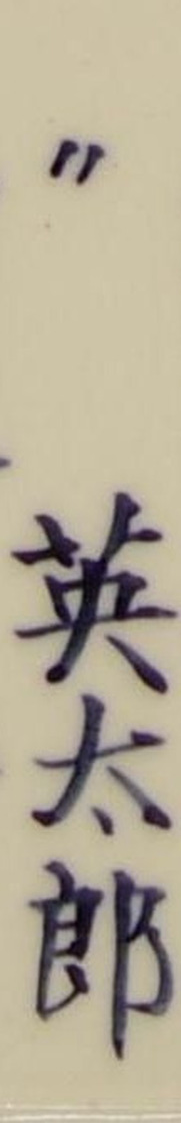英太郎
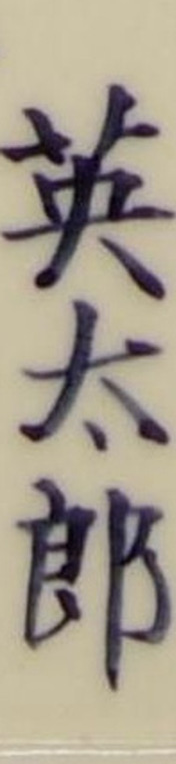英太郎
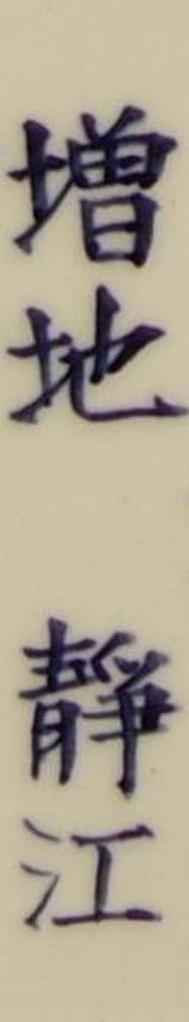増地静江
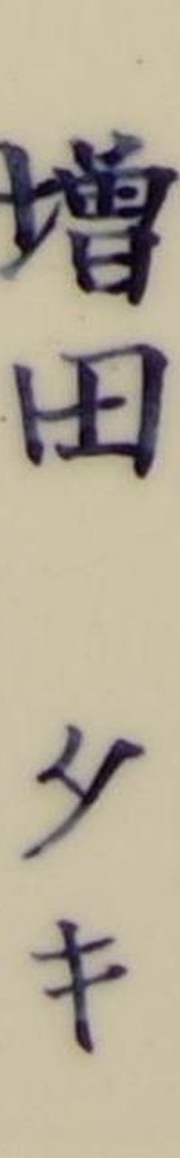増田夕キ
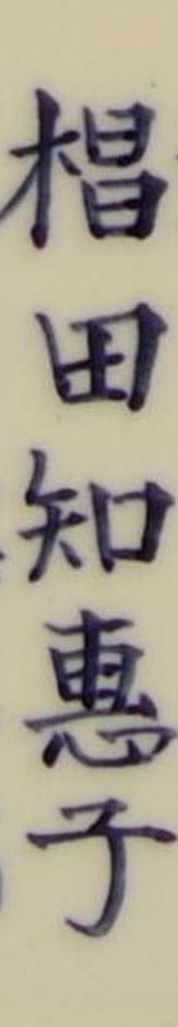椙田知惠子
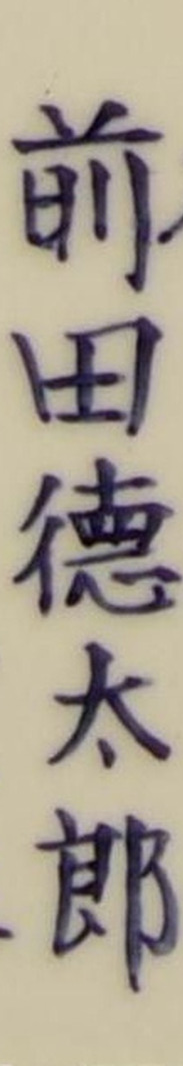前田徳太郎
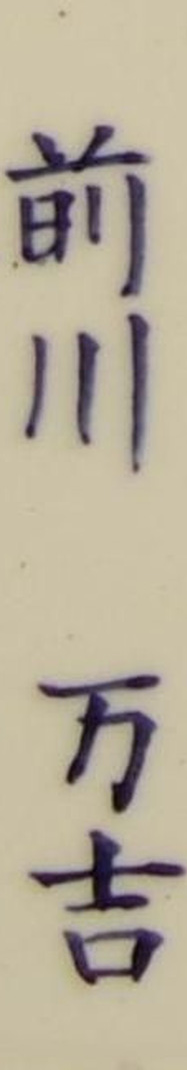前川万吉
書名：E~L
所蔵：高野山金剛峯寺
